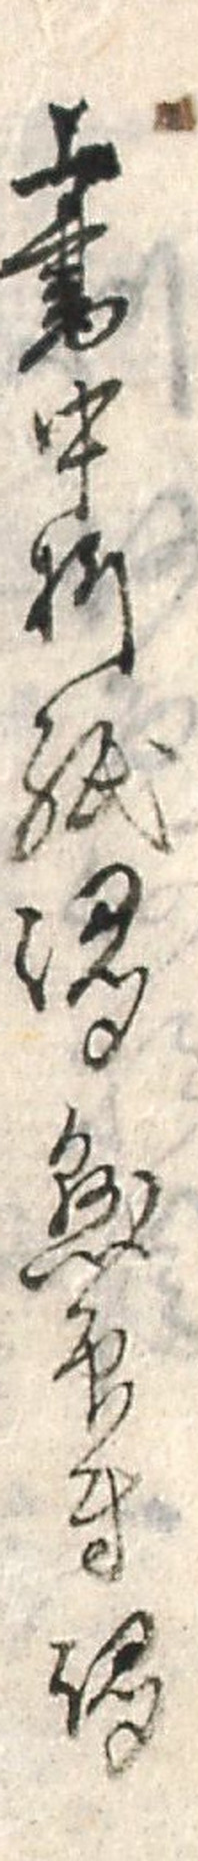上書中折紙認め懸印付認め
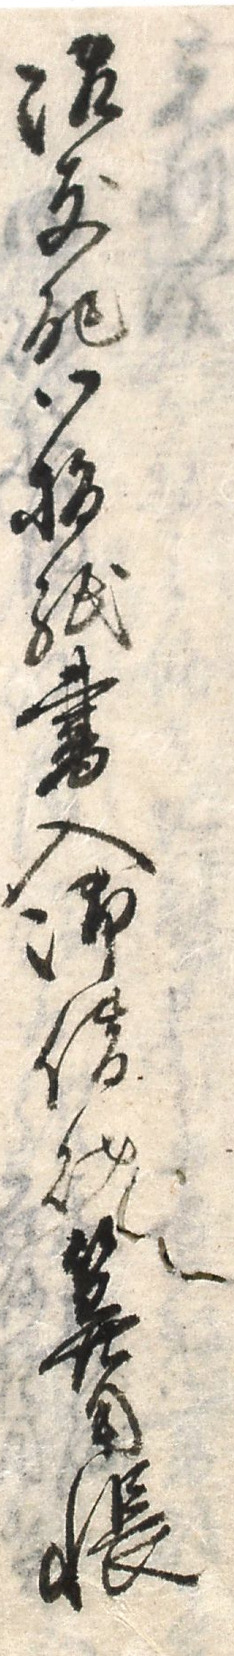御支配御指紙書入御借財算用帳
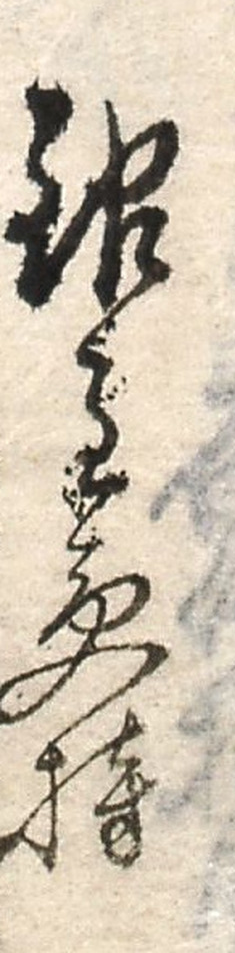銀主受持
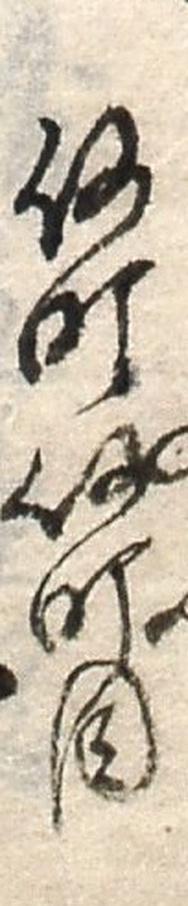何町何町目
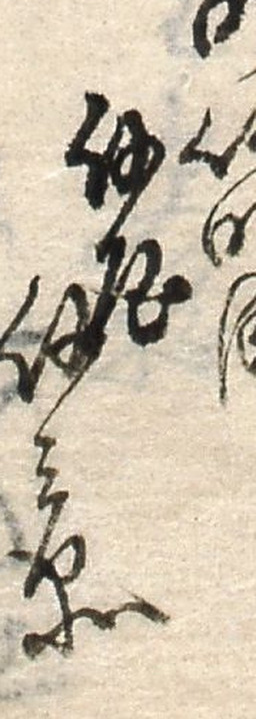何兵衛
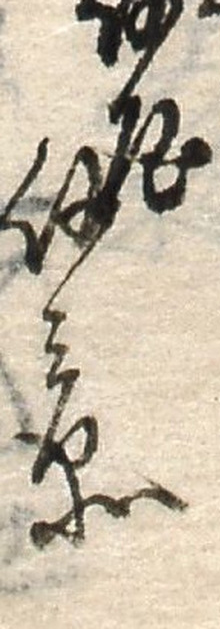何兵衛
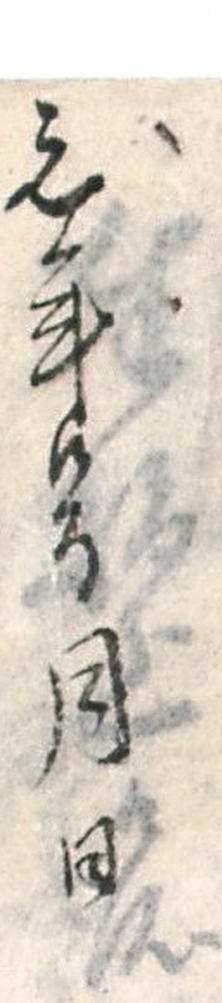元年号月日
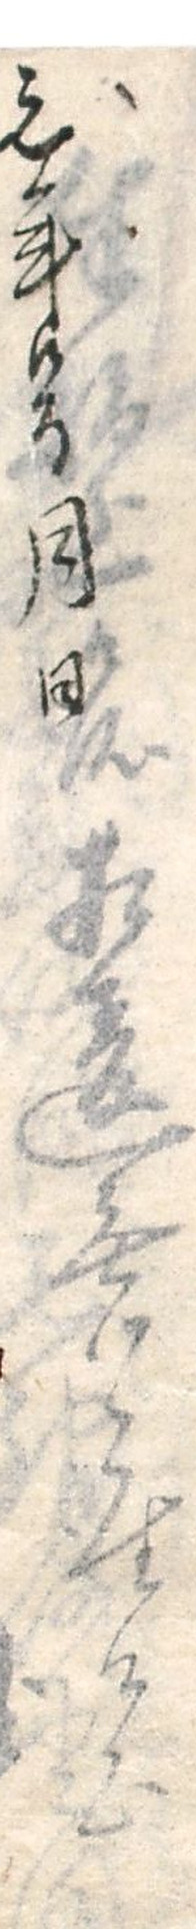元年号月日
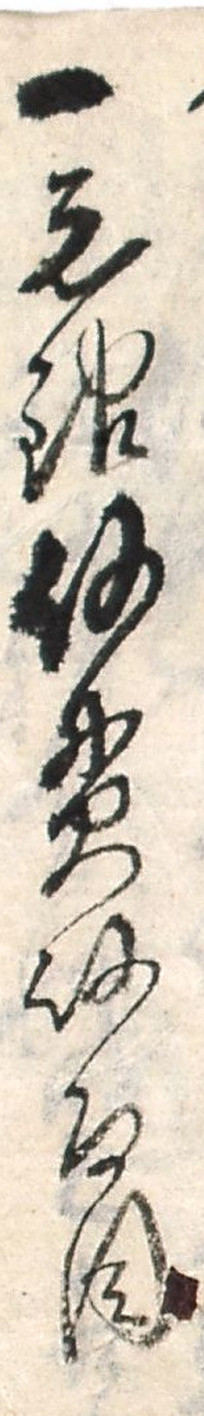残元銀何貫何匁目
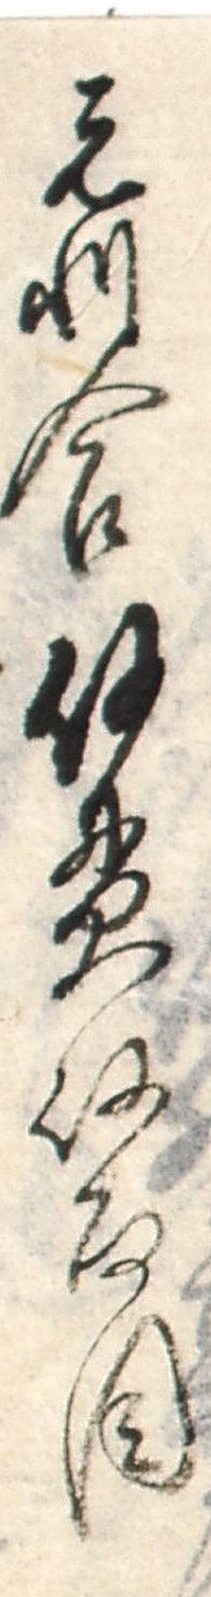元利合何貫何百目
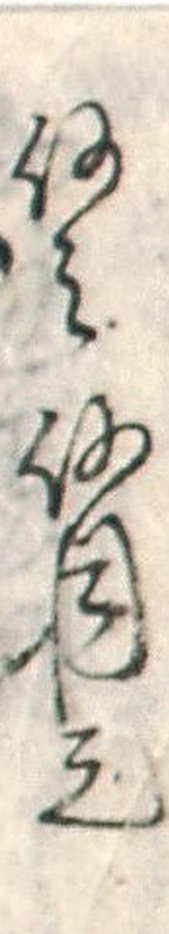何之何月也
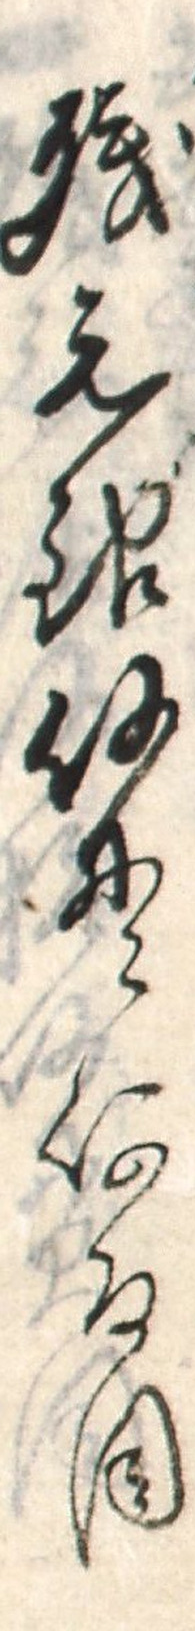残元銀何貫何匁目
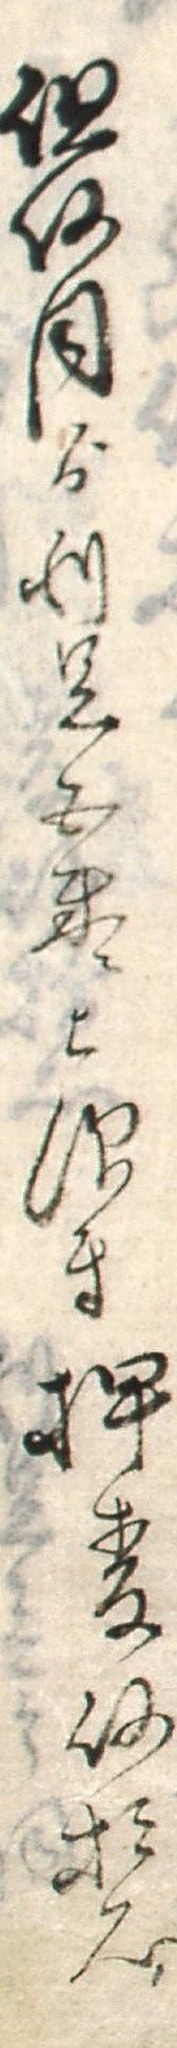但何月ゟ利足五朱に被仰付押麦何拾石
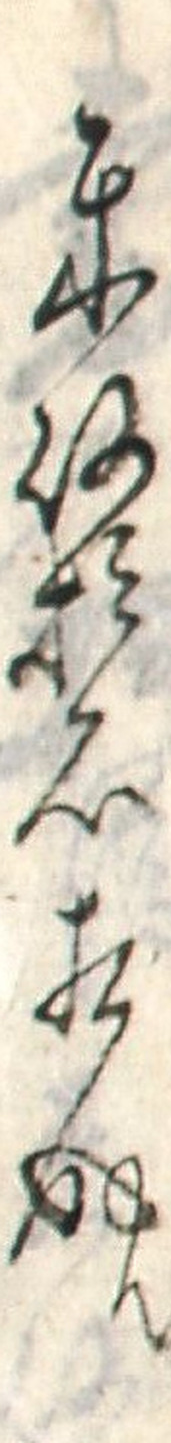米何拾石払成候

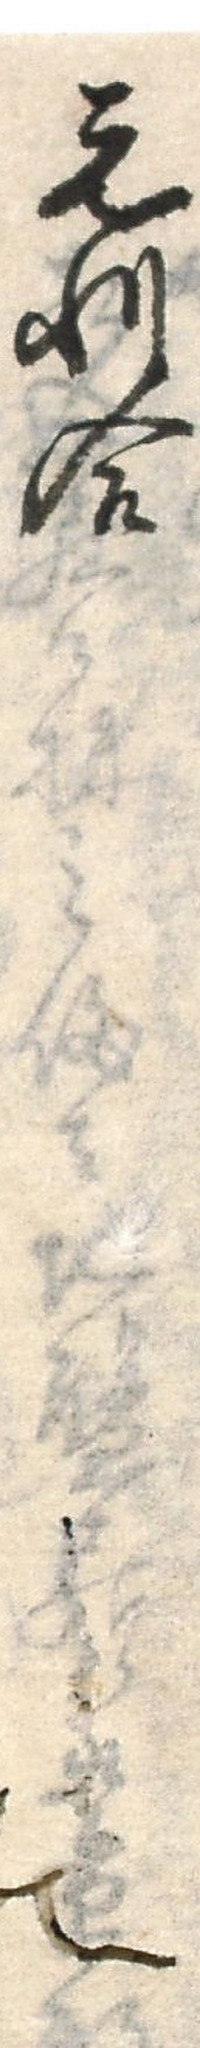元利合
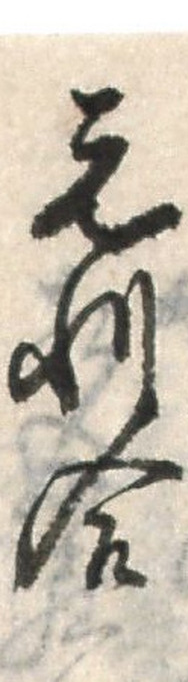元利合
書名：御家中并無格御奉公人借銀御仕解一件御書付写其余共控
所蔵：鳴門教育大学 Naruto University of Education
